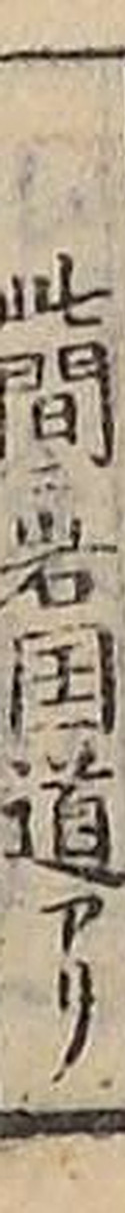此間ニ岩国道アリ
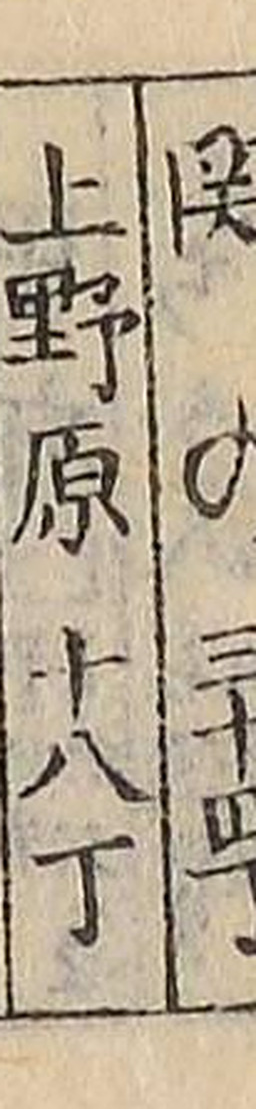上野原十八丁
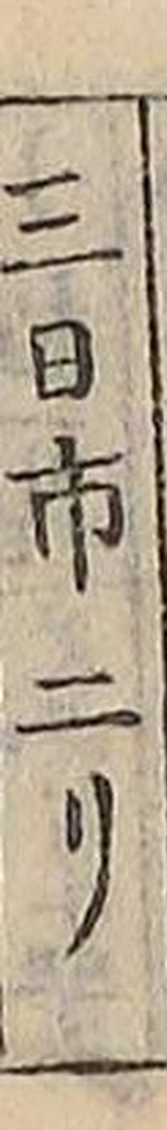三日市二リ
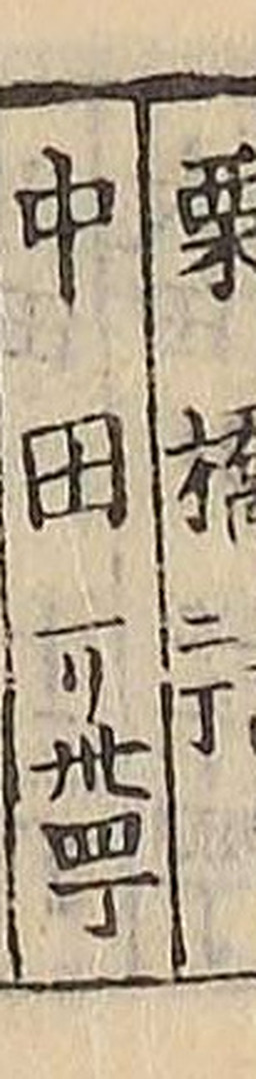中田一リ卅四丁
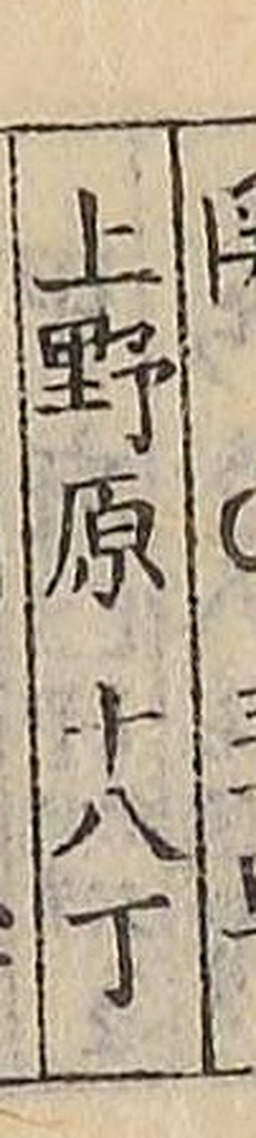上野原十八丁
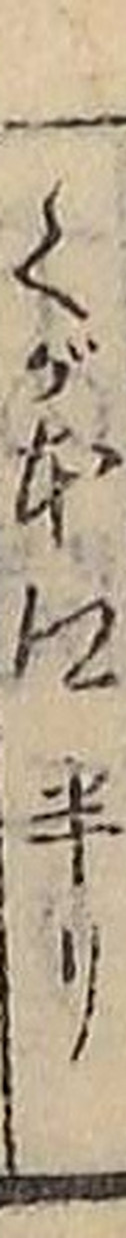くが本郷半リ
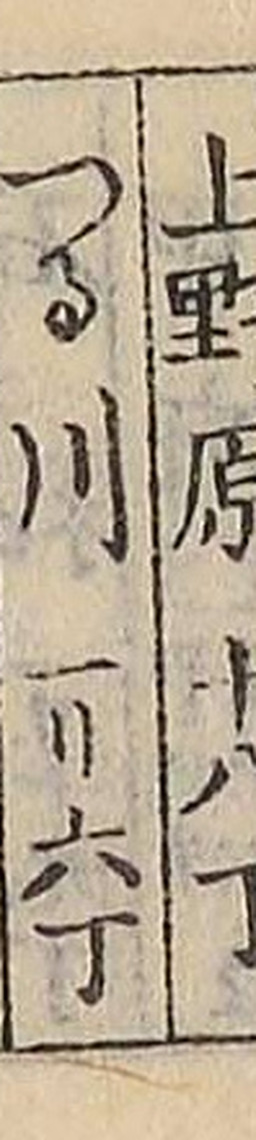つる川一リ六丁
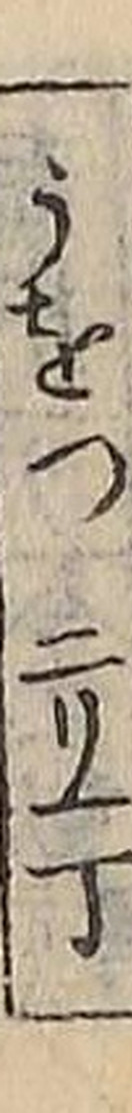うをつ二リ一丁
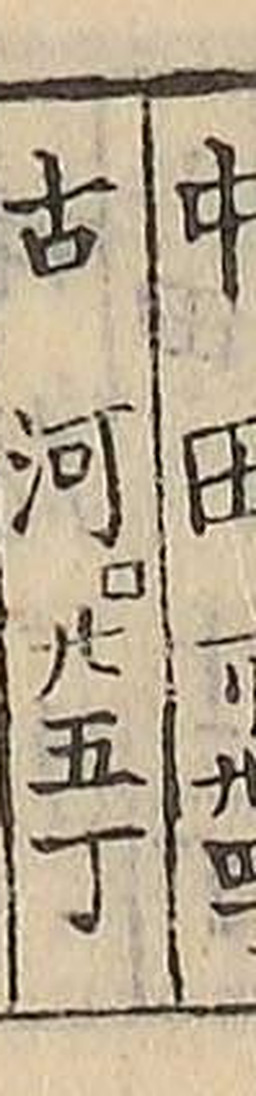古河▫廿五丁
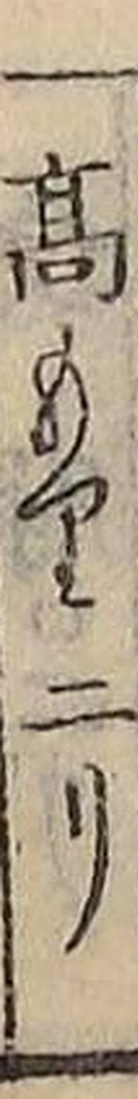高もり二リ
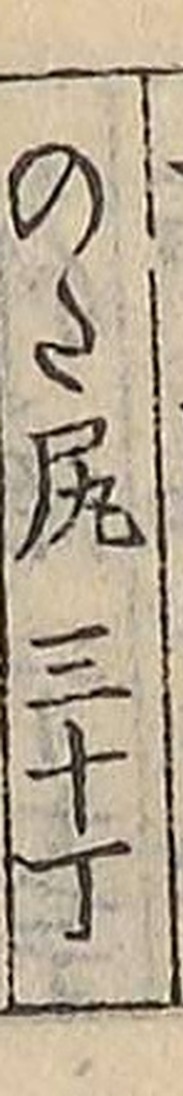のた尻三十丁
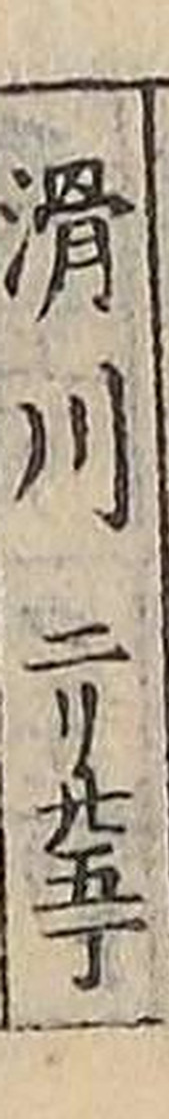滑川二リ廿五丁
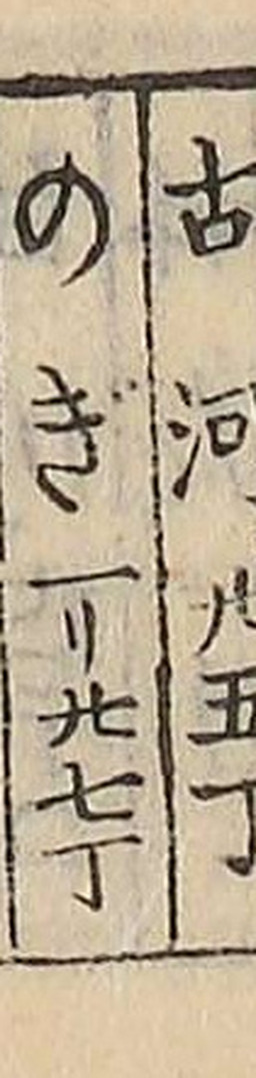のぎ一リ廿七丁
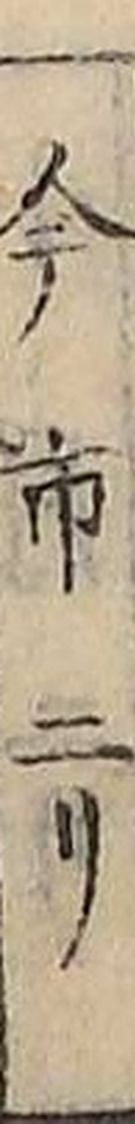今市二リ
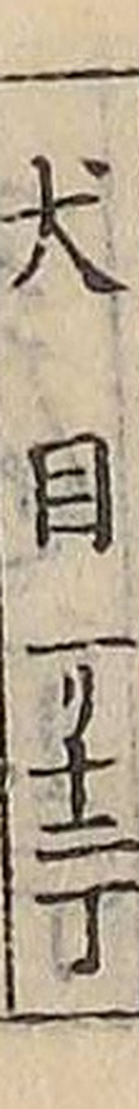犬目一リ十二丁
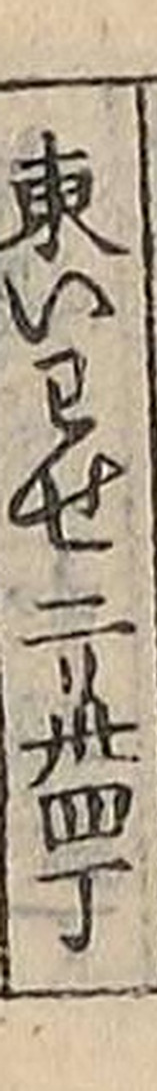東いわせ二リ卅四丁
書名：旅行用心集
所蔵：神戸大学附属図書館 国文学研究資料館
